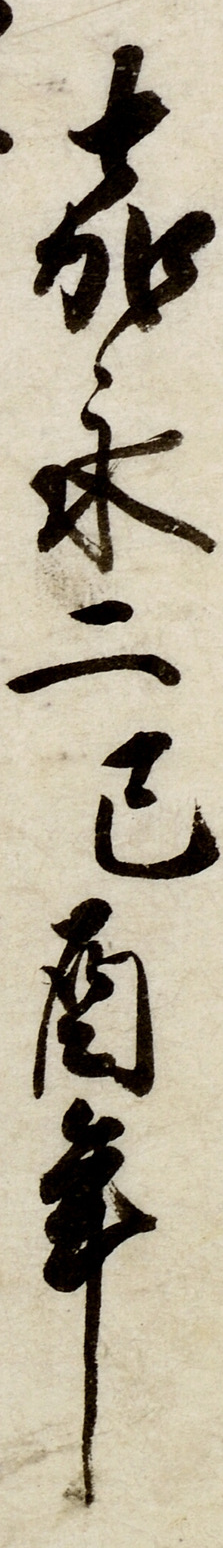嘉永二己酉年
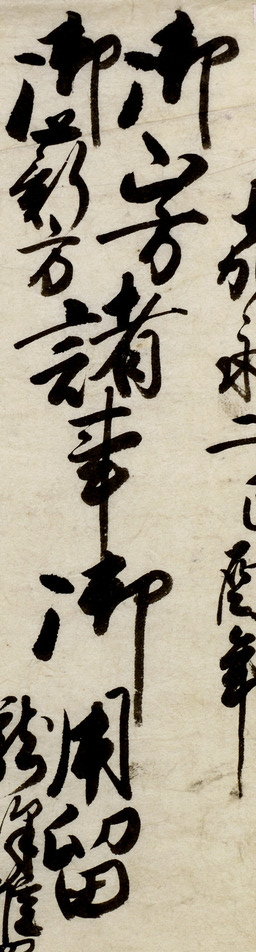御薪方諸事御用留
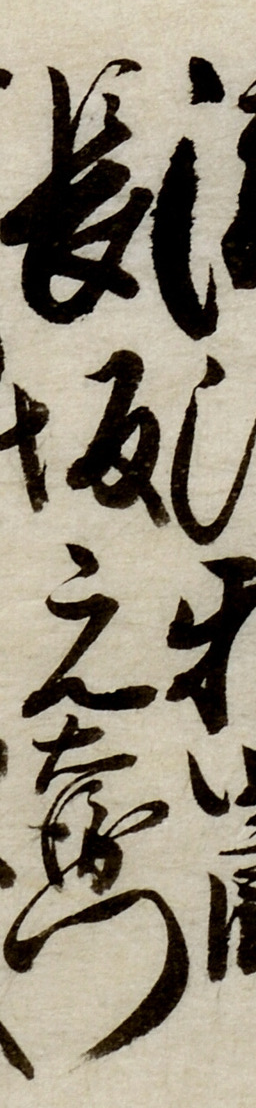長坂元右衞門
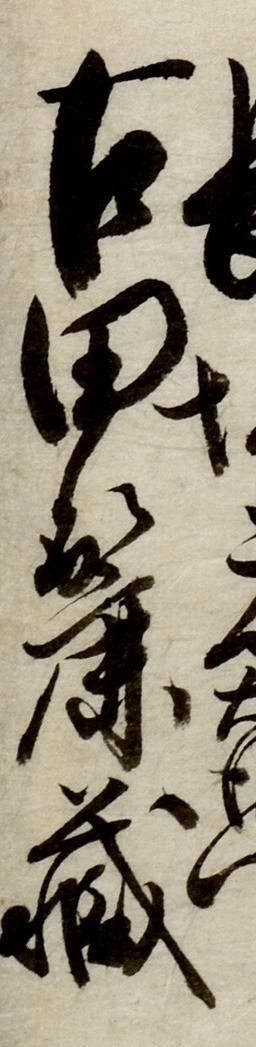古田麗蔵

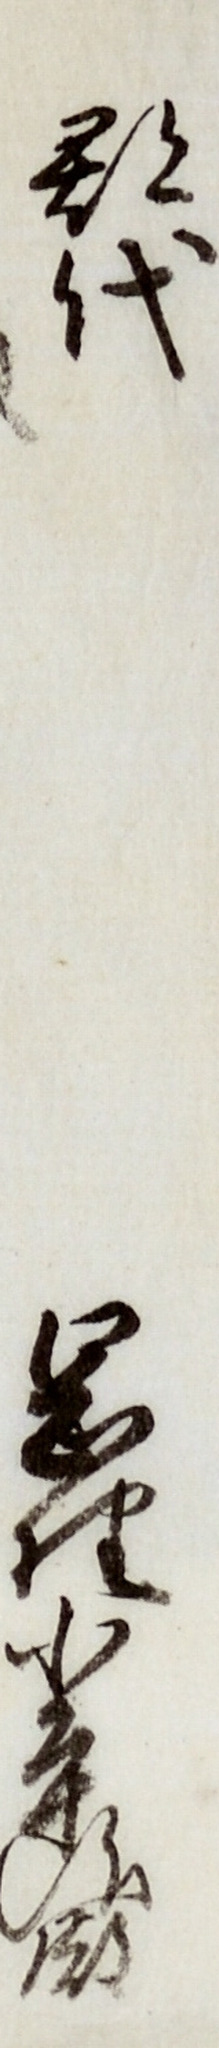郡代岡野小平治殿
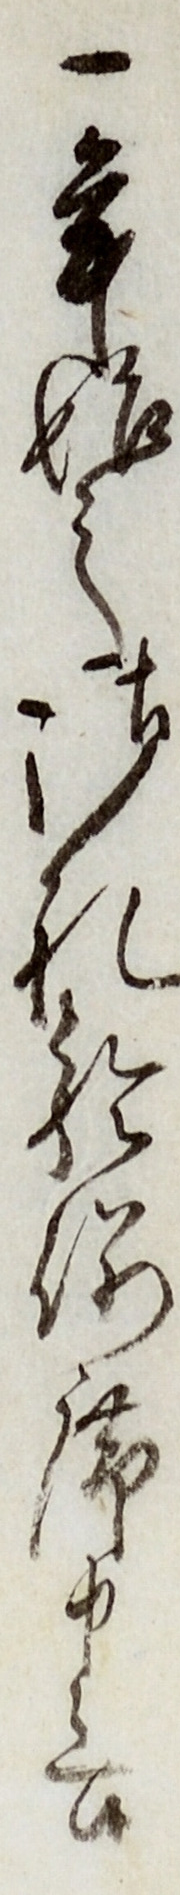一年始之御礼於例席申上候
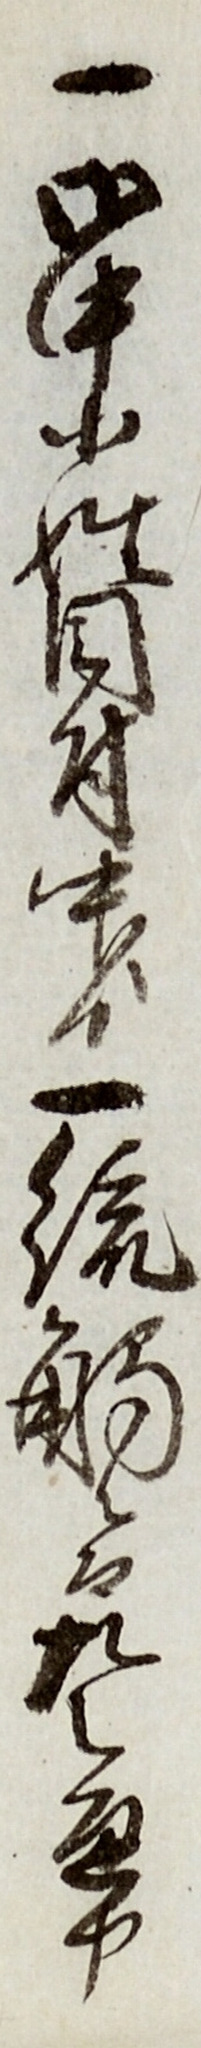一御中小姓目付中ゟ一統触ニ而左之通申
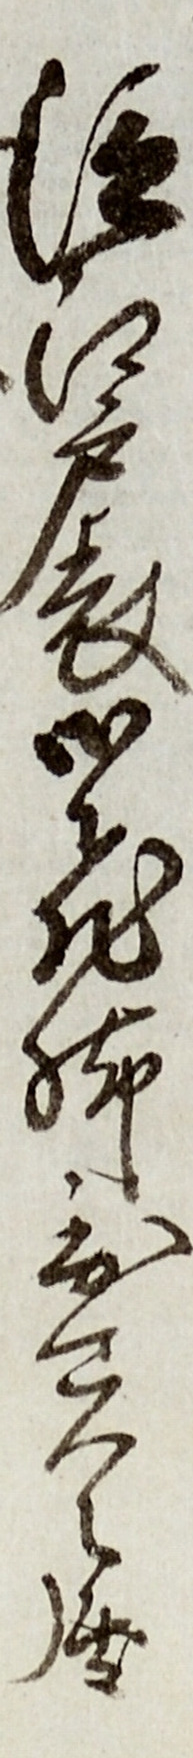従江戸表御飛脚到着之処
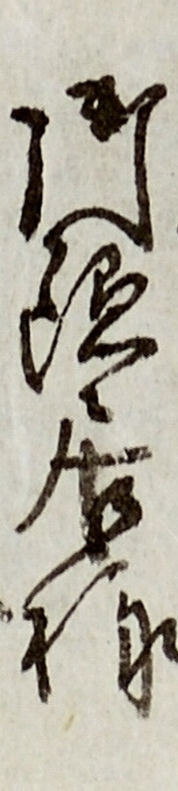御隠居様
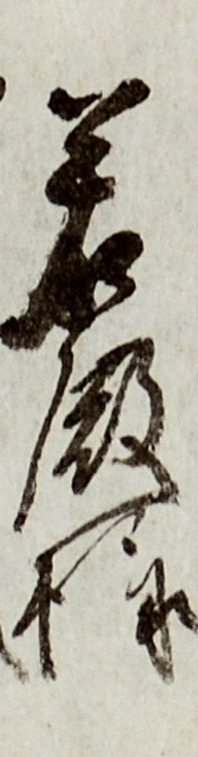若殿様
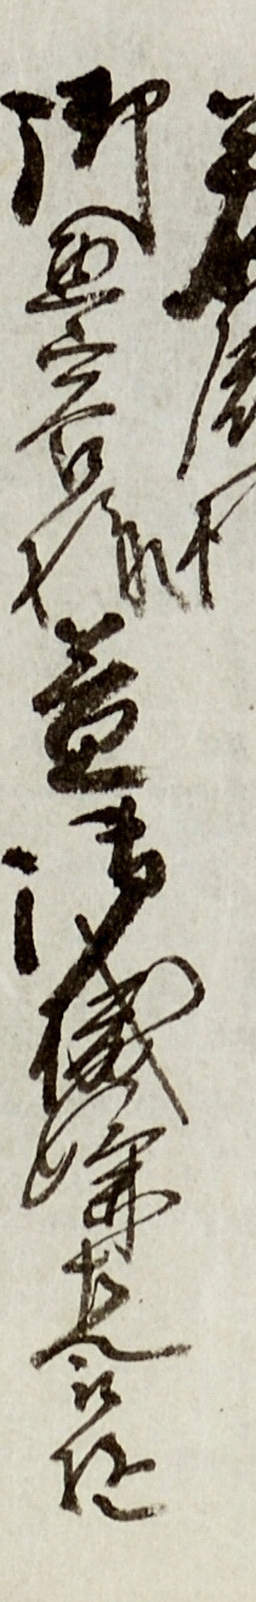御惣容様益御機嫌克被遊
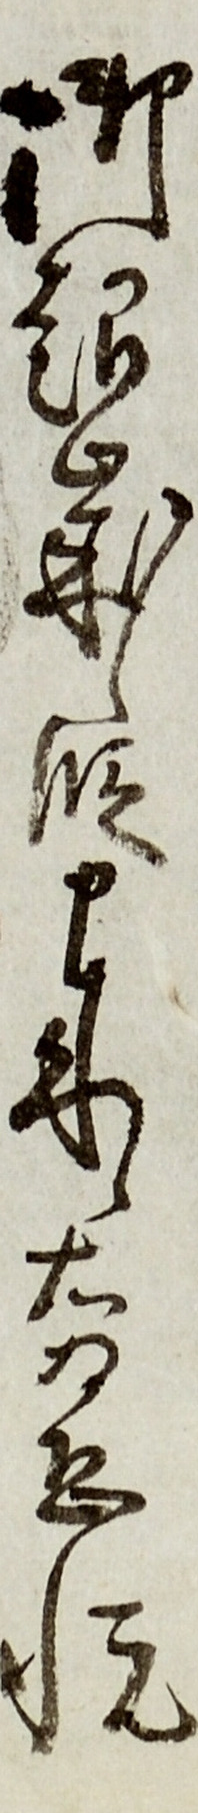御超歳候段申来候右為恐悦
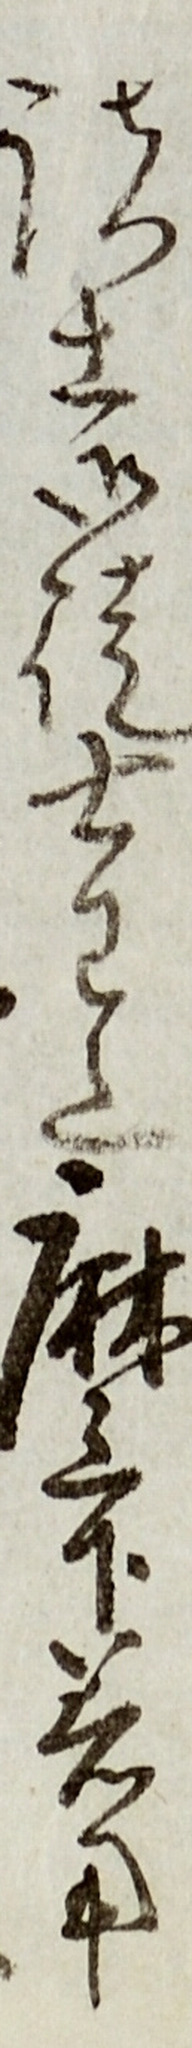諸士御徒士已上麻上下着用
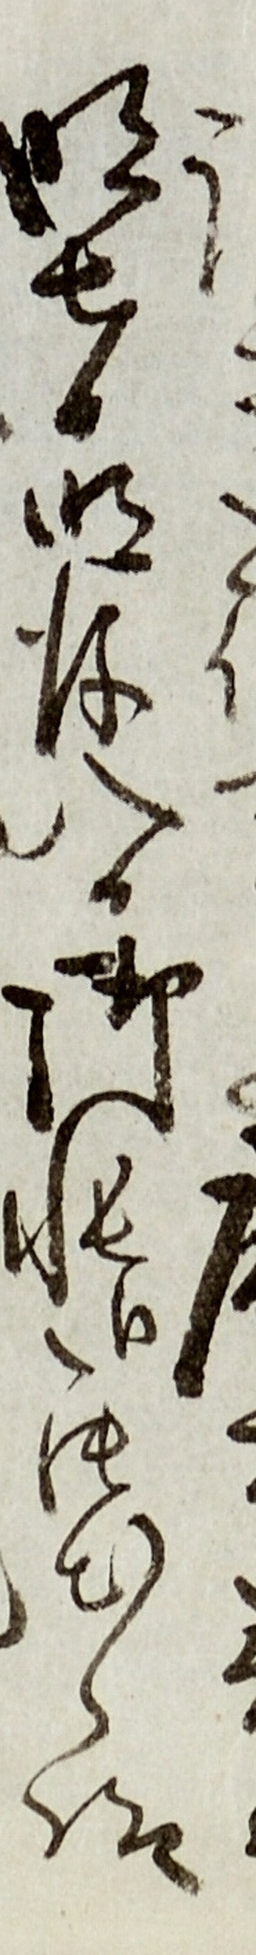明七日明後八日御帳江罷出候様
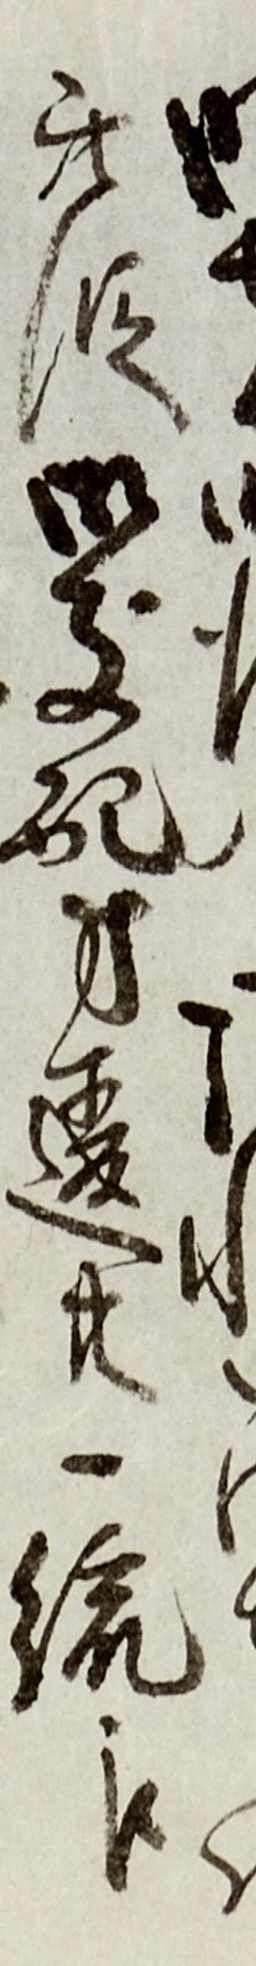其段御支配方違共一統江
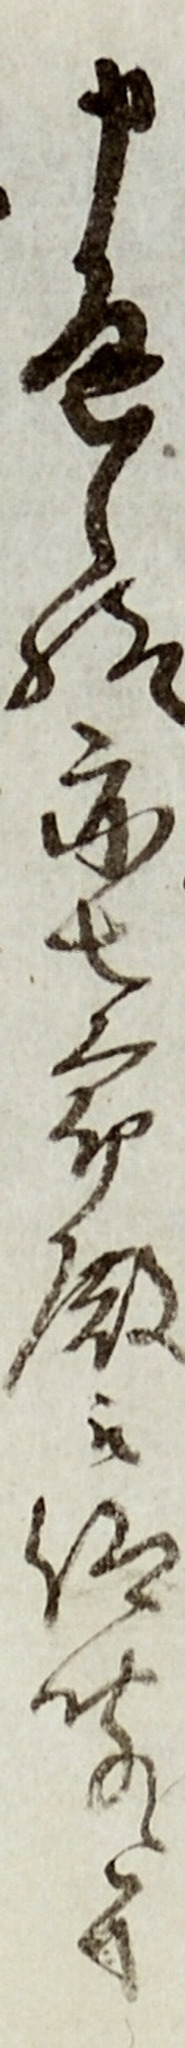申通候様亦七郎殿被仰聞候ニ付
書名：御山方御薪方諸事御用留
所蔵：伊那市立高遠町図書館・合同会社AMANE
